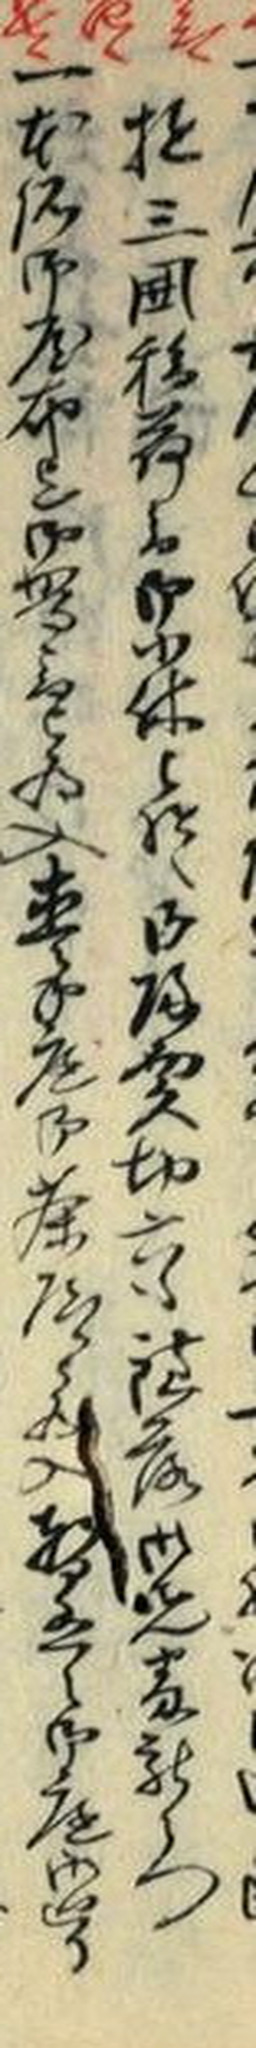一本所御屋布迄御駕ニ而被為入直ニ御庭御茶屋へ被為入暫有之御庭御廻り
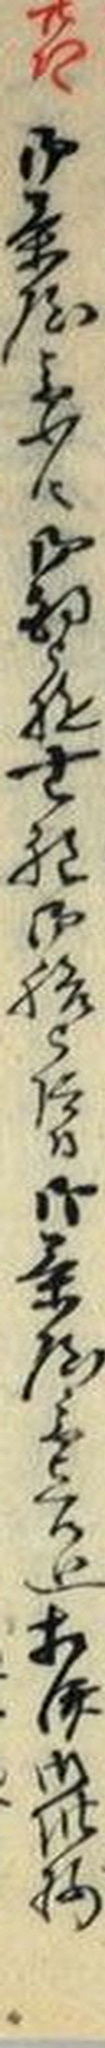御茶屋ニ而少々御被遊無程御膳被仰付御茶屋ニ而被召上相済御供揃
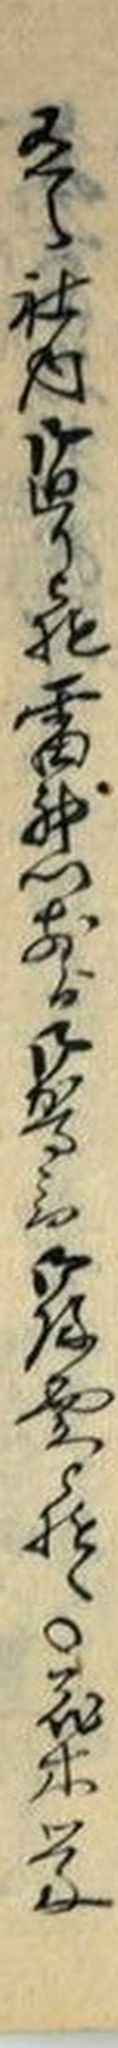有之社内御廻り被遊雷神門前ゟ御駕ニ而御帰殿被遊候○花木栄

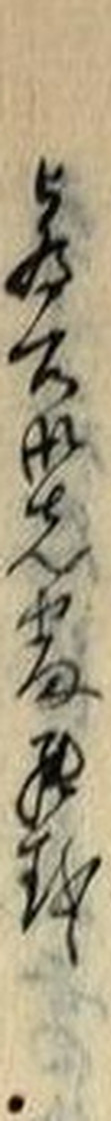被為召御先番罷越候
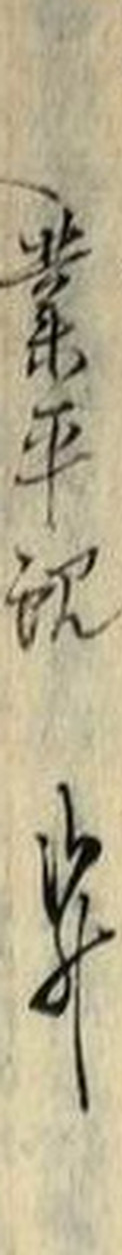業平蜆弐升
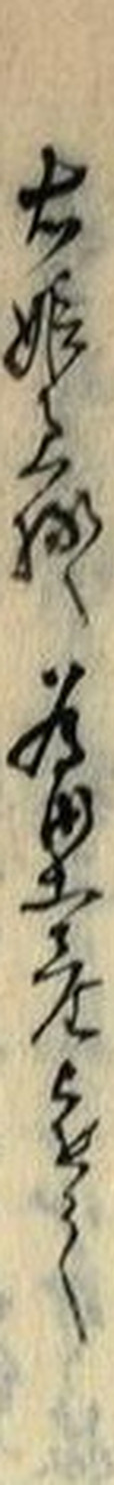右姫君様へ為御土産被進之
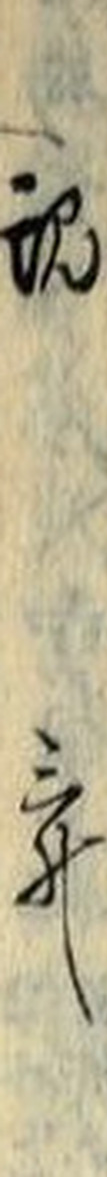蜆三升
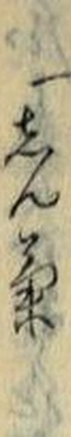しん菊
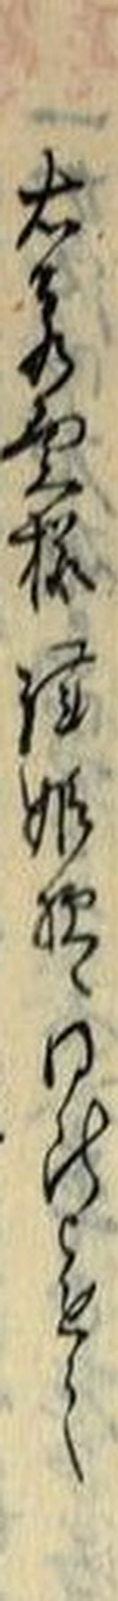右若殿様謹姫様へ同断被進之
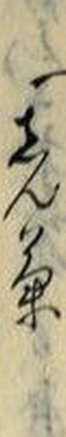しん菊
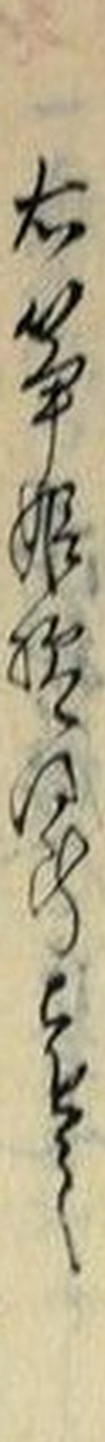右箏姫様へ同断被進之
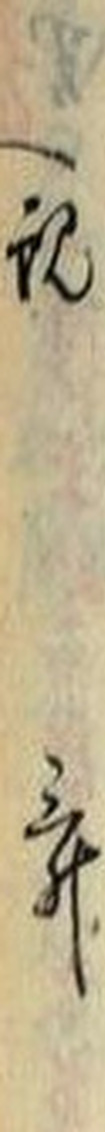蜆三升
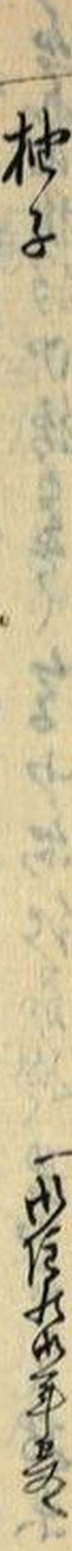柚子御住居御年寄へ
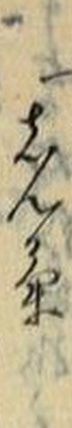しん菊
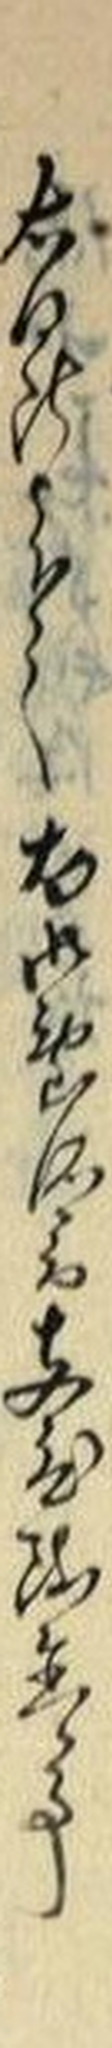右同断被下之右御台所ニ而支度致置候事
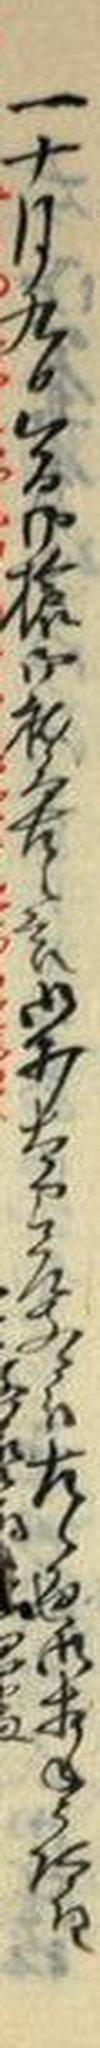一十月九日今日御槍御稽古之節御打太刀差支ニ付左之通御相手被仰付候
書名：少傅日録抄（斉承付側向頭取日記、在府）
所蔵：福井県文書館 Fukui Prefectural Archives
